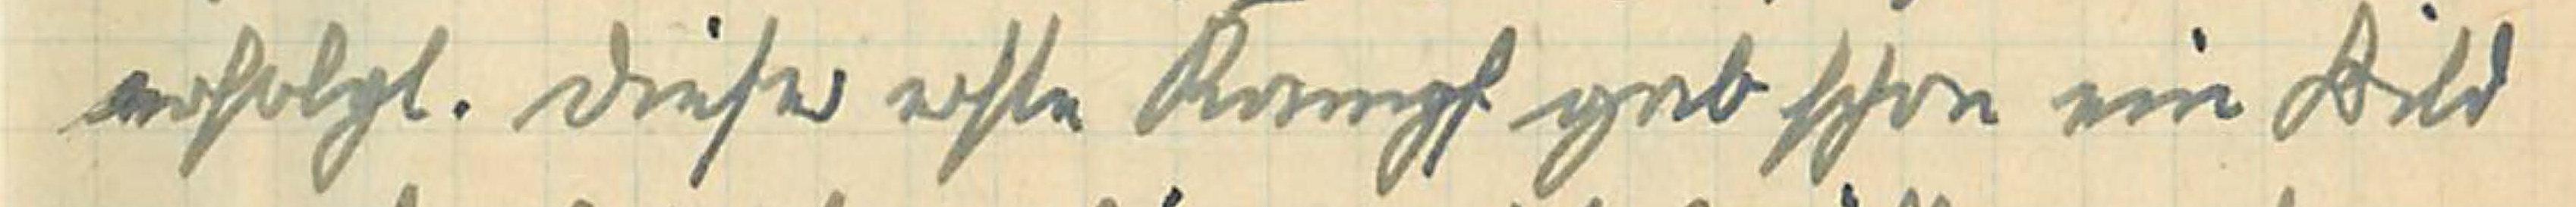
erfolgt. Dieser erste Kampf gab schon ein Bild
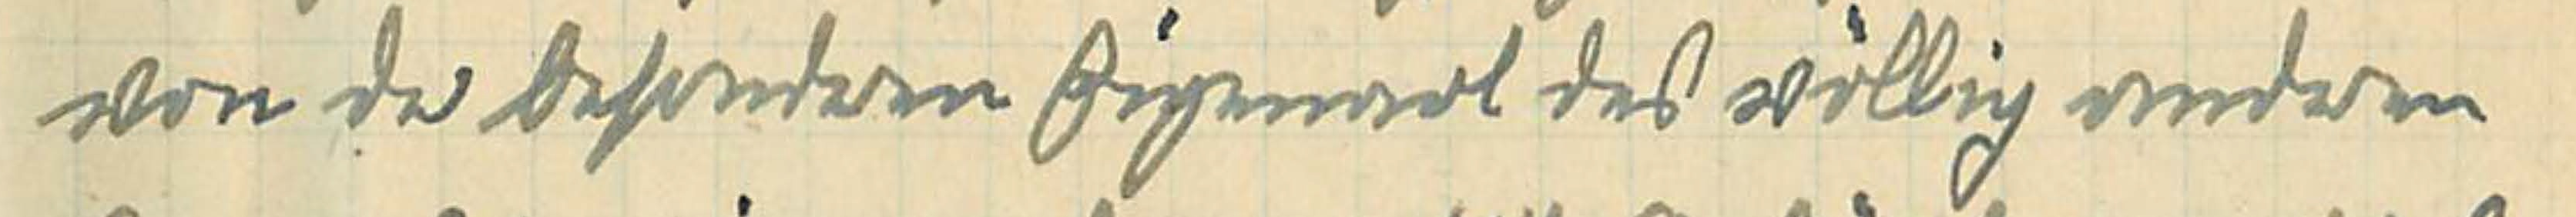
von der besonderen Eigenart des völlig anderen
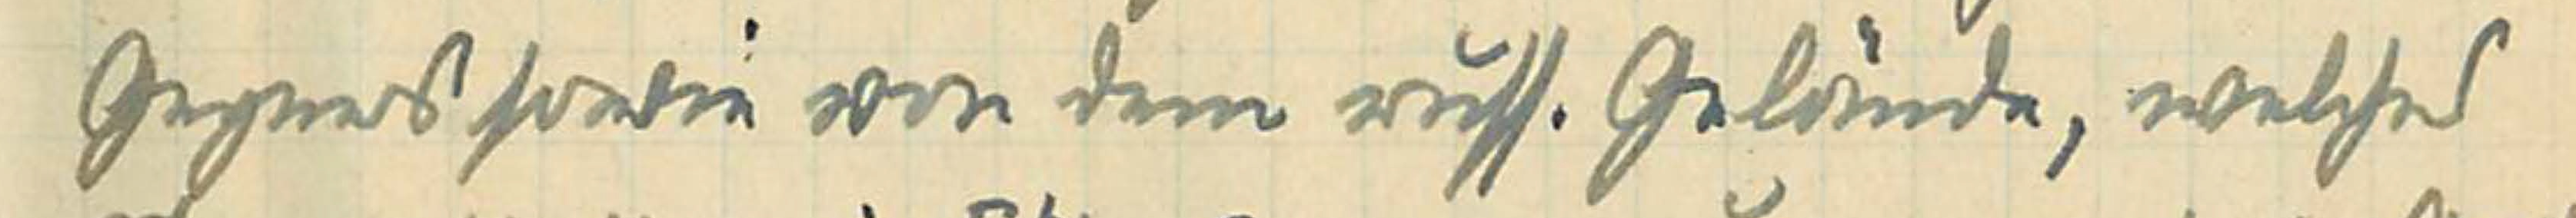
Gegners sowie von dem russ. Gelände, welches
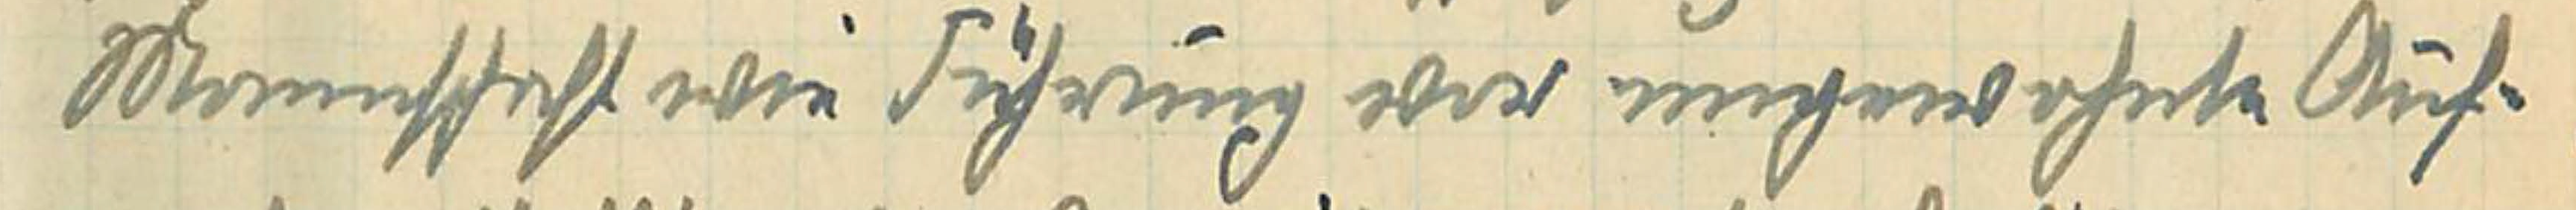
Mannschaft wie Führung vor ungewohnte Auf-
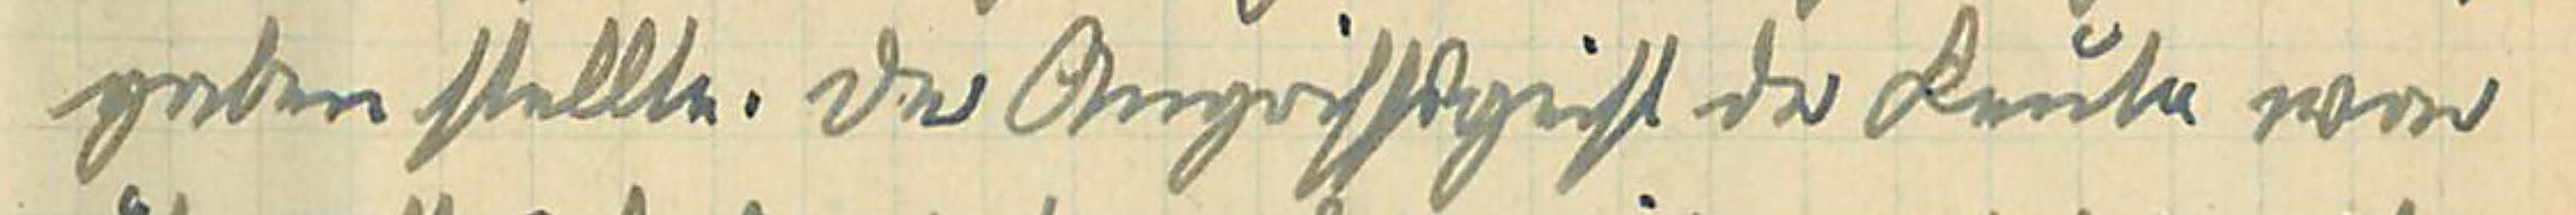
gaben stellte. Der Angriffsgeist der Leute war
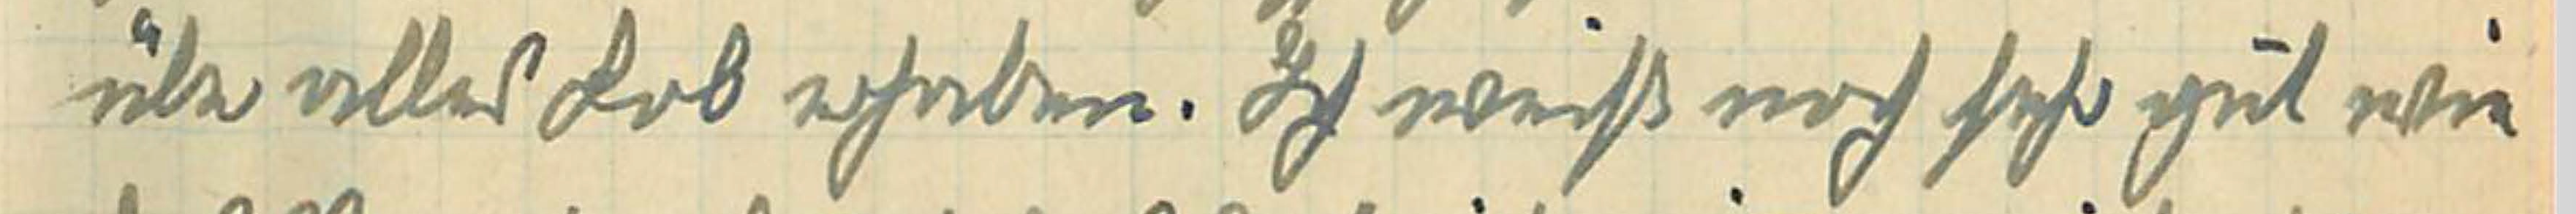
über alles Lob erhaben. Ich weiß noch sehr gut wie
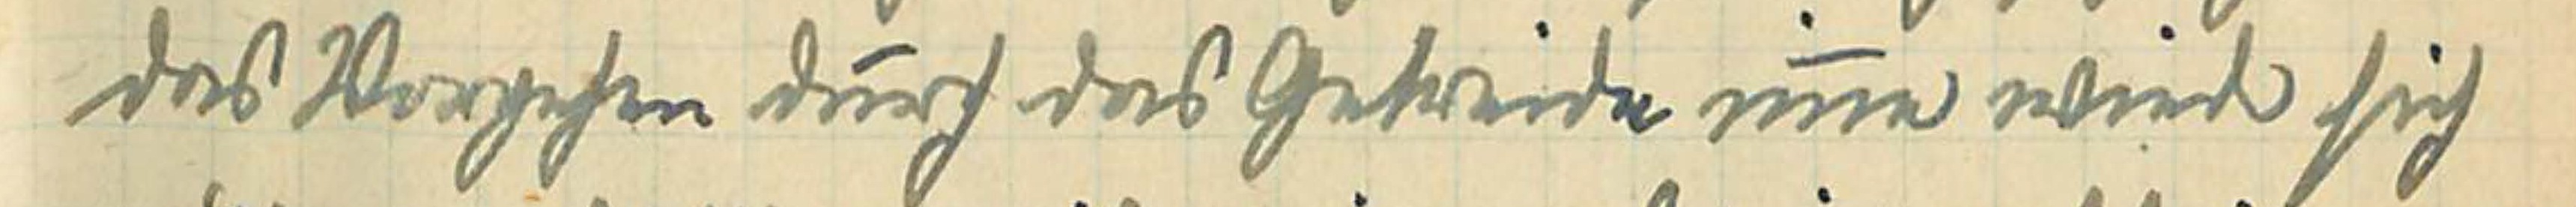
das Vorgehen durch das Getreide immer wieder sich
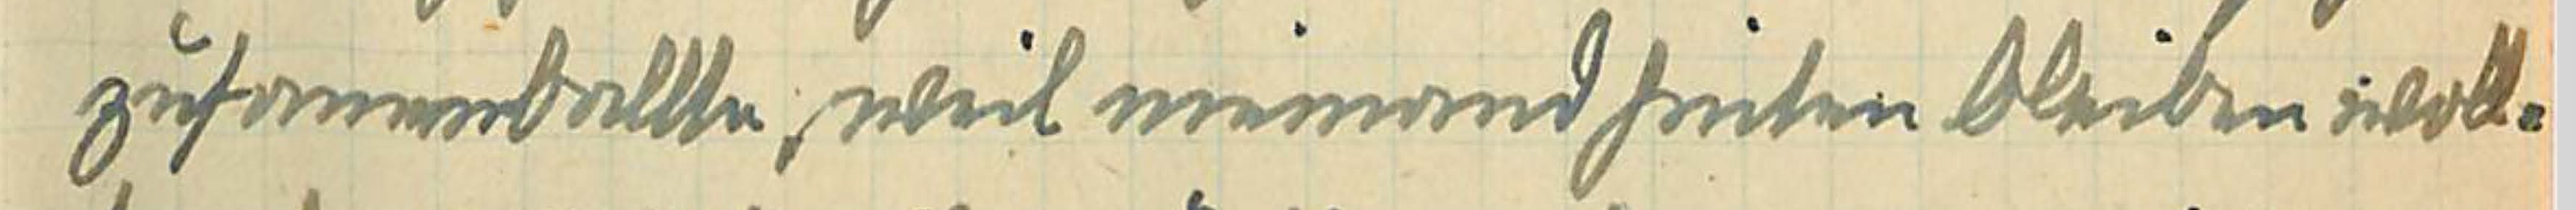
zusammenballte, weil niemand hinten bleiben woll-
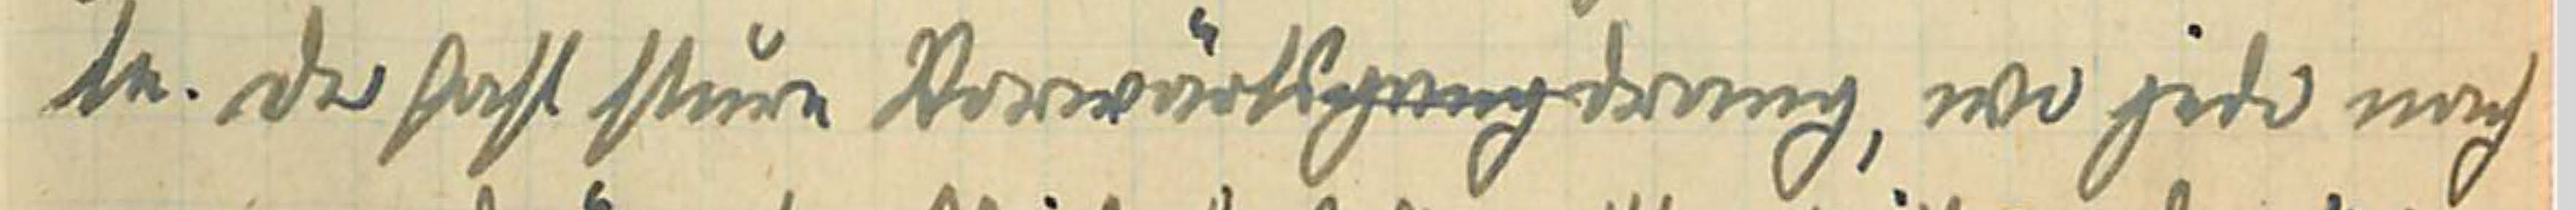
te. Der fast sture Vorwärtsgangdrang, wo jeder nach
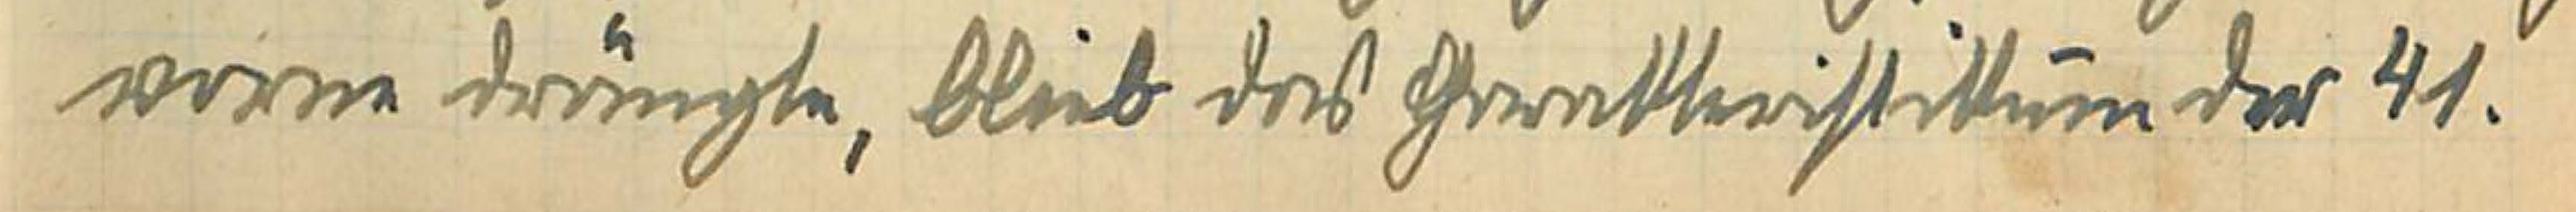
vorne drängte, blieb das Charakteristikum der 41.
